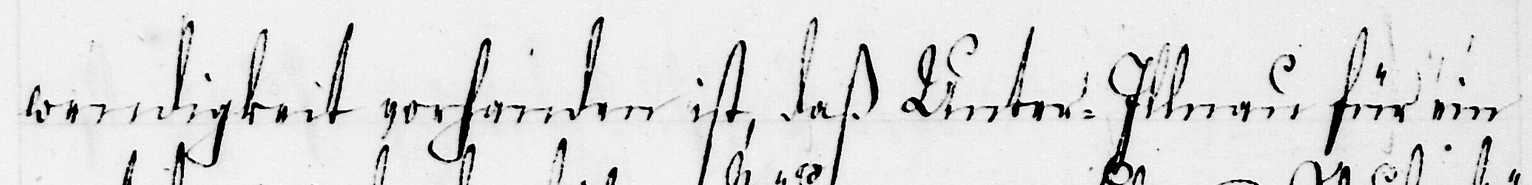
wendigkeit vorhanden ist, daß Unter-Illnau für ein
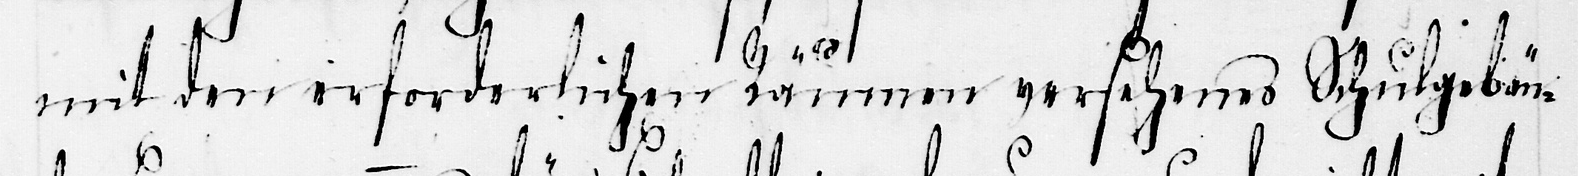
mit den erforderlichen Räumen versehenes Schulgebäu¬
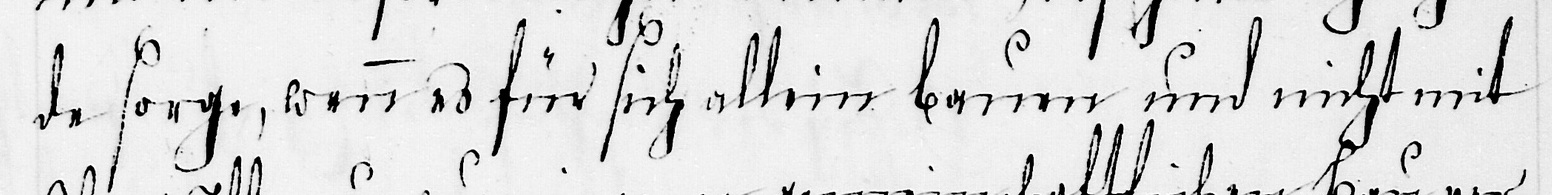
de sorge, wenn es für sich allein bauen und nicht mit
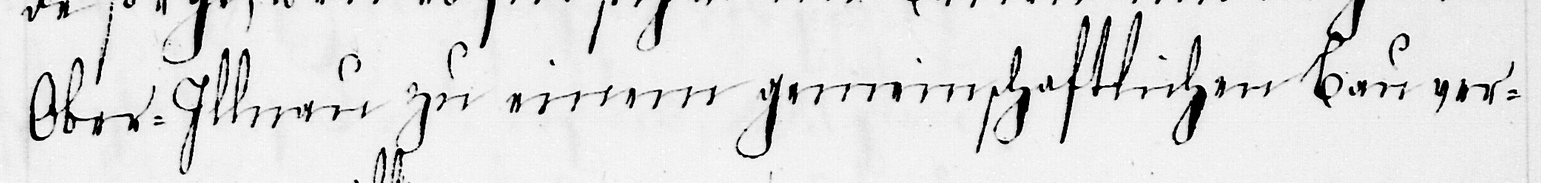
Ober-Illnau zu einem gemeinschaftlichen Bau ver¬
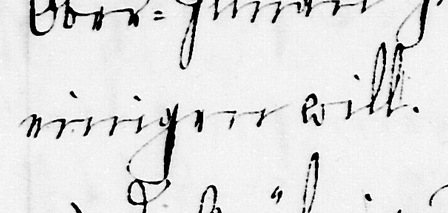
einigen will.
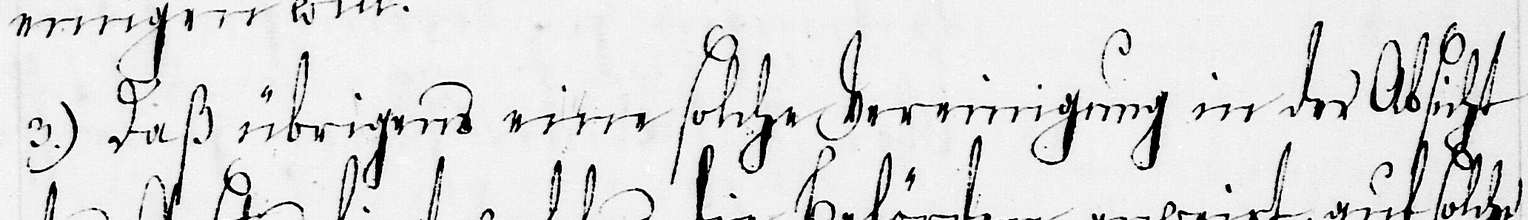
3.) Daß übrigens eine solche Vereinigung in der Absicht
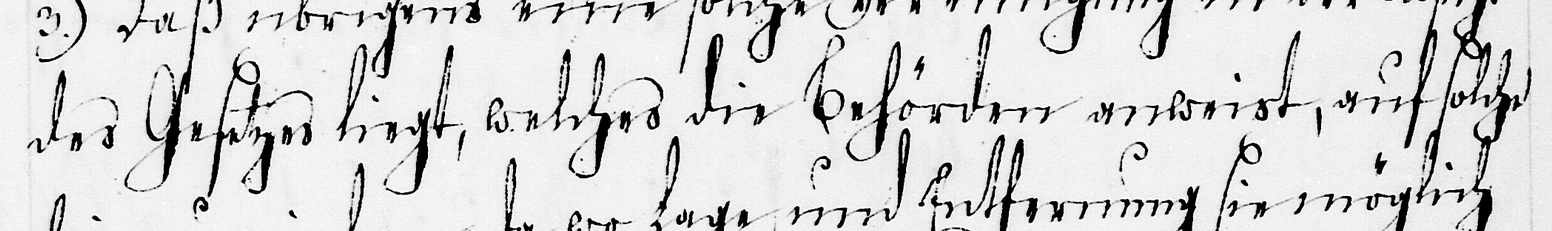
des Gesetzes liegt, welches die Behörden anweist, auf solc¬
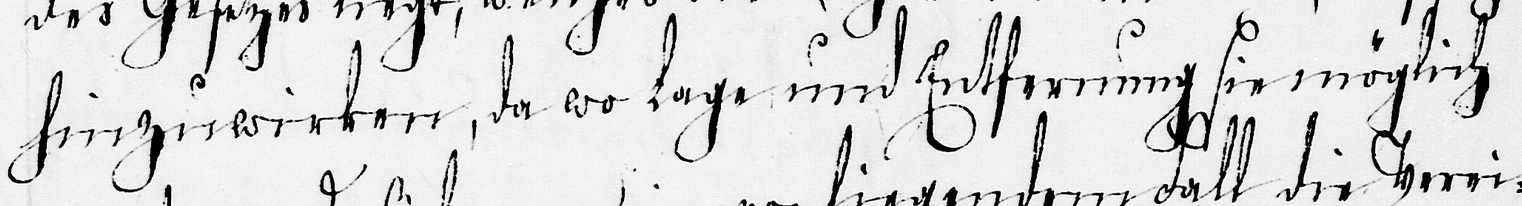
hinzuwirken, da wo Lage und Entfernung sie möglich
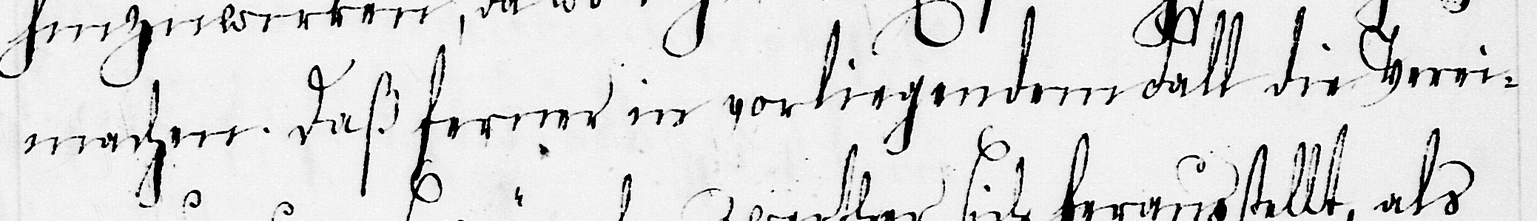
machen. Daß ferner in vorliegendem Fall die Verei¬
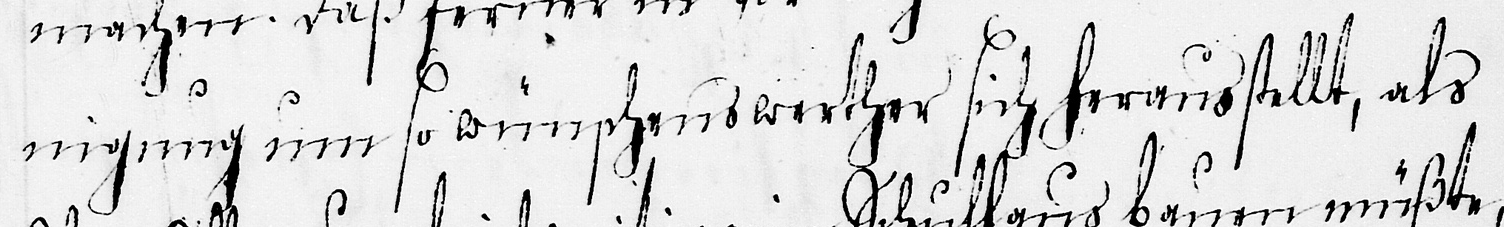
nigung um so wünschenswerther sich herausstellt, als
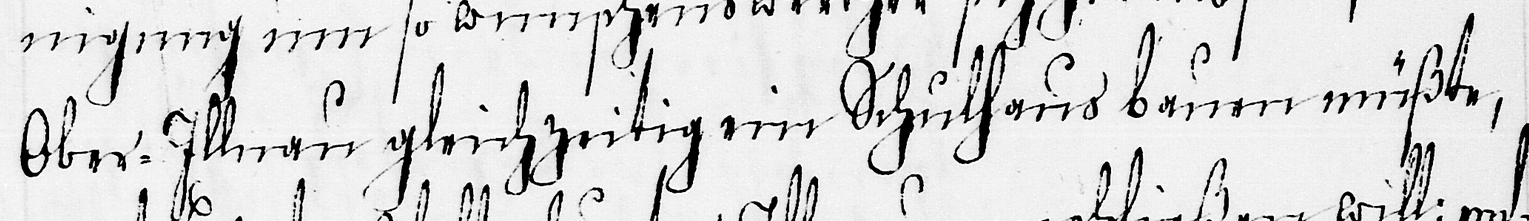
Ober-Illnau gleichzeitig ein Schulhaus bauen müßte,
